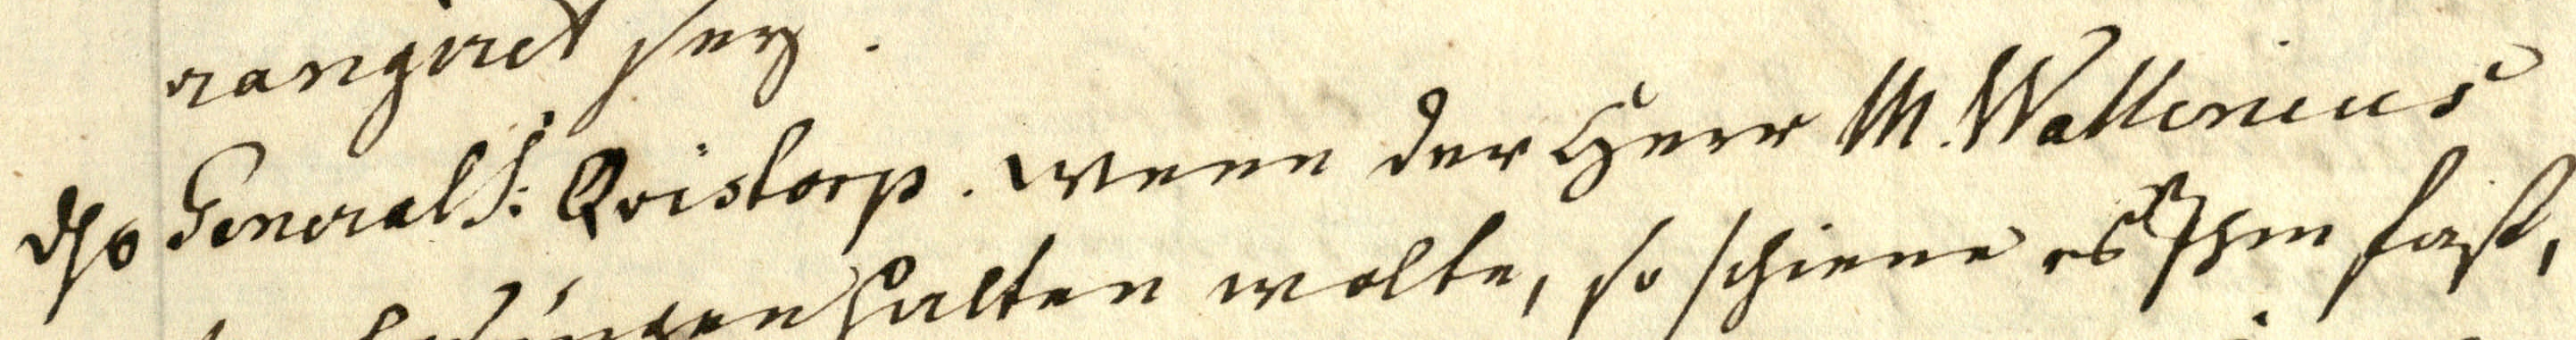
dh GeneralS. Quistorp wenn der Herr M. Wallenius
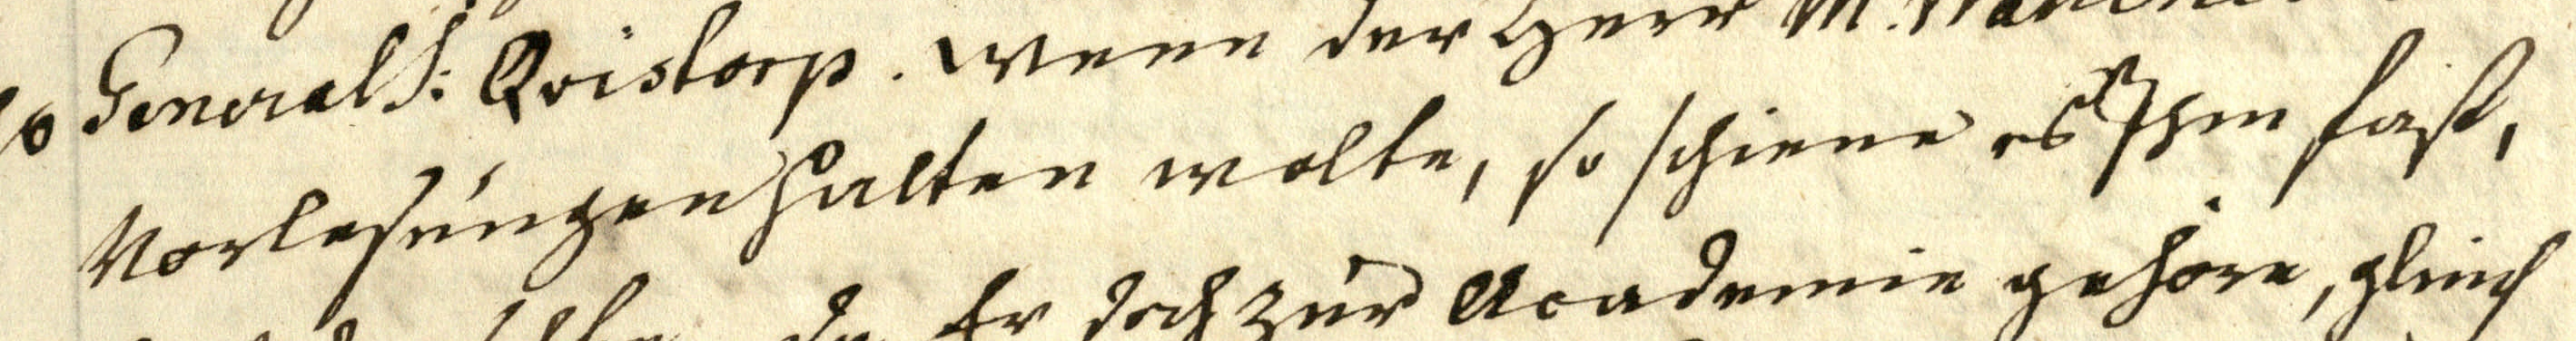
Vorlesungen halten wolte, so schiene es Ihm fast,
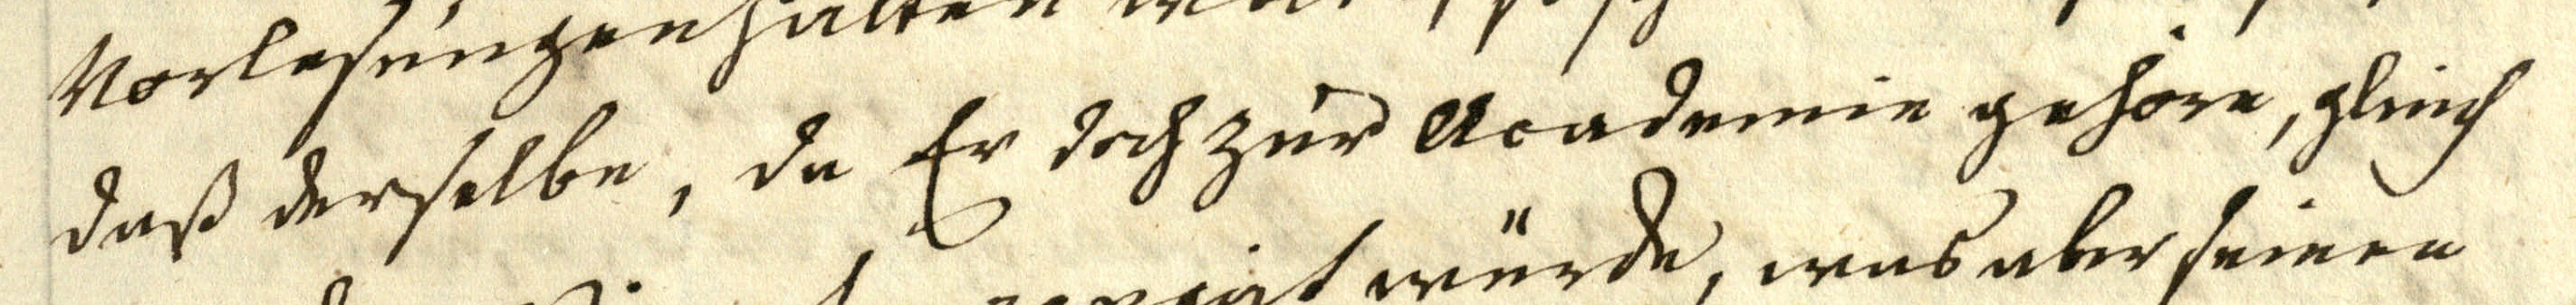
daß derselbe, da Er doch zur Academie gehöre, gleich
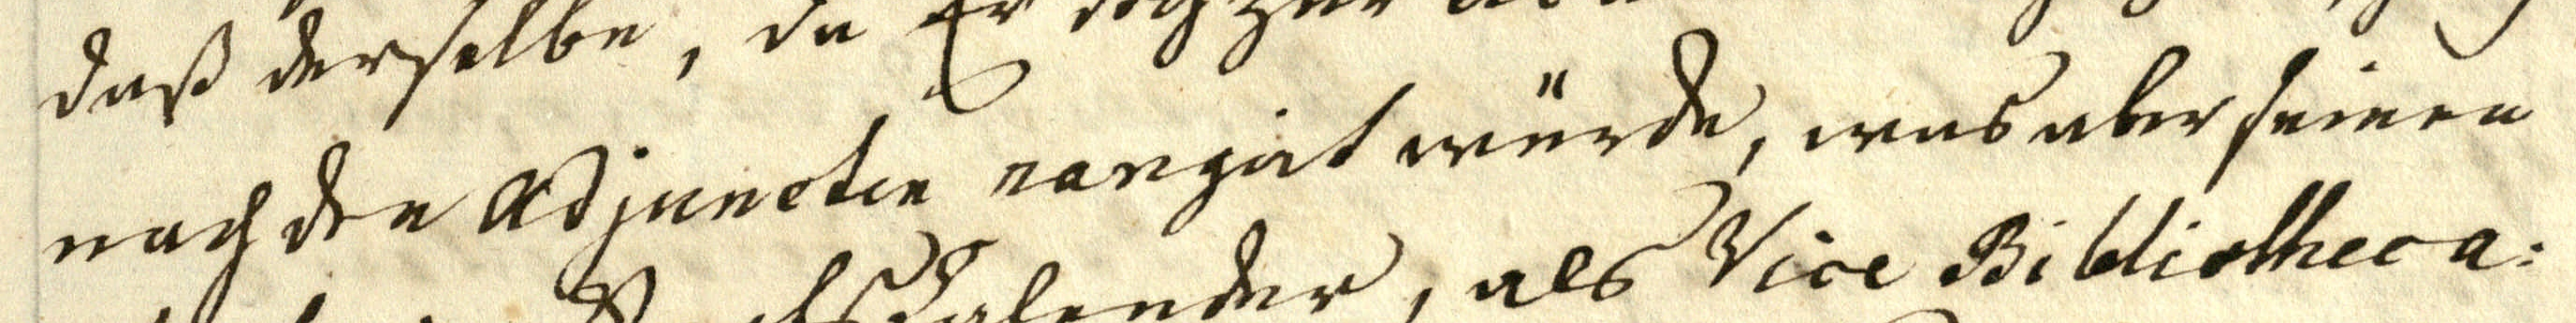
nach den Adjuncten rangirt würde, was aber seinen
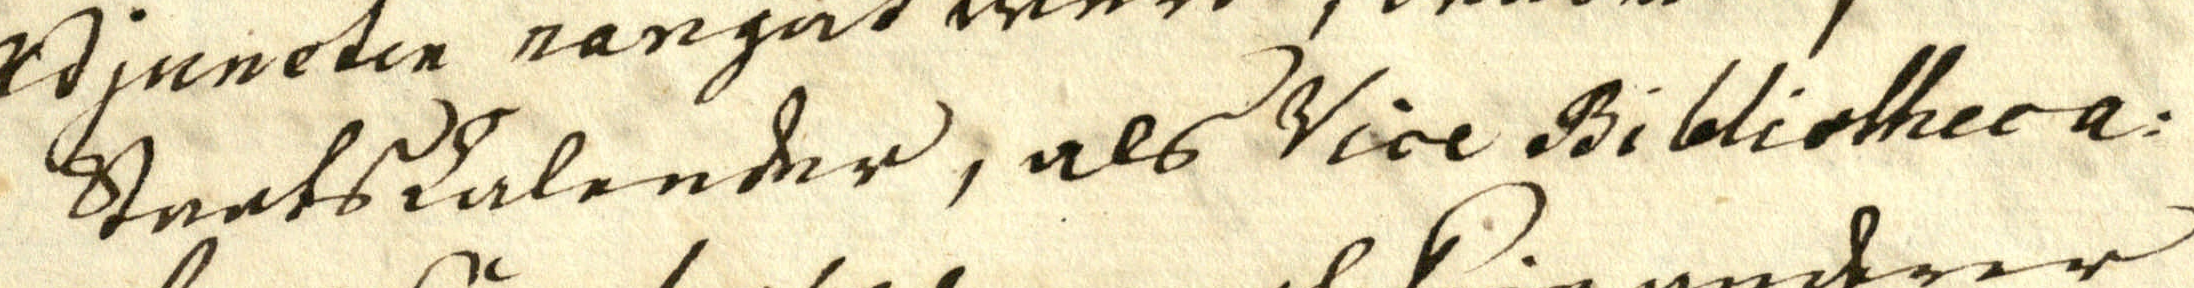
Platz im Staatskalender, als Vice Bibliotheca¬
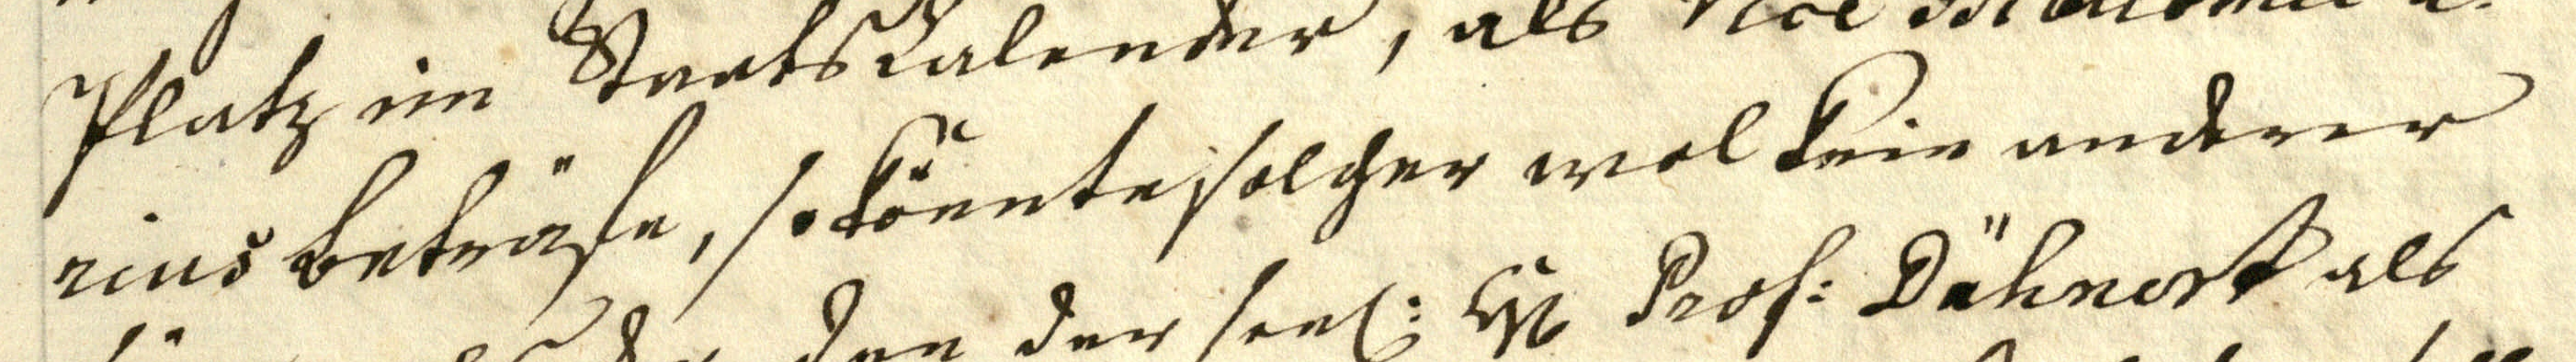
rius beträfe, so könnte solcher wol kein anderer
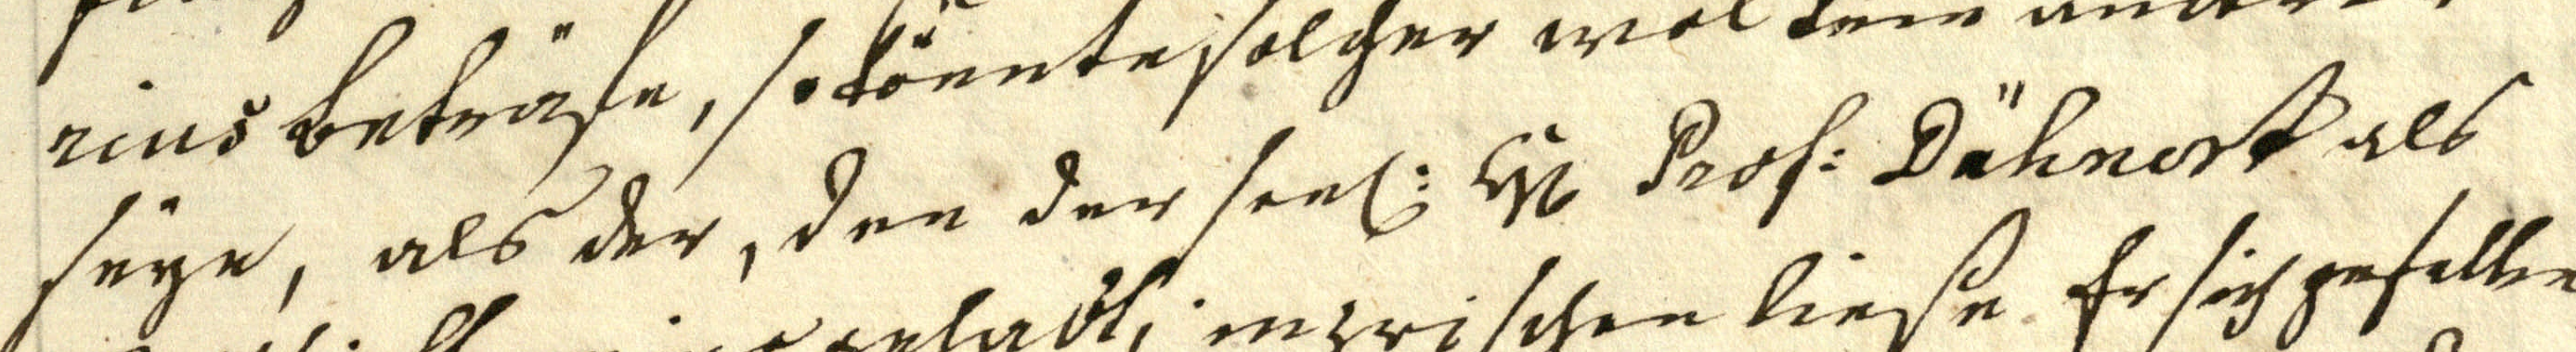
seÿn, als der, den der seel. H Prof. Dähnert als
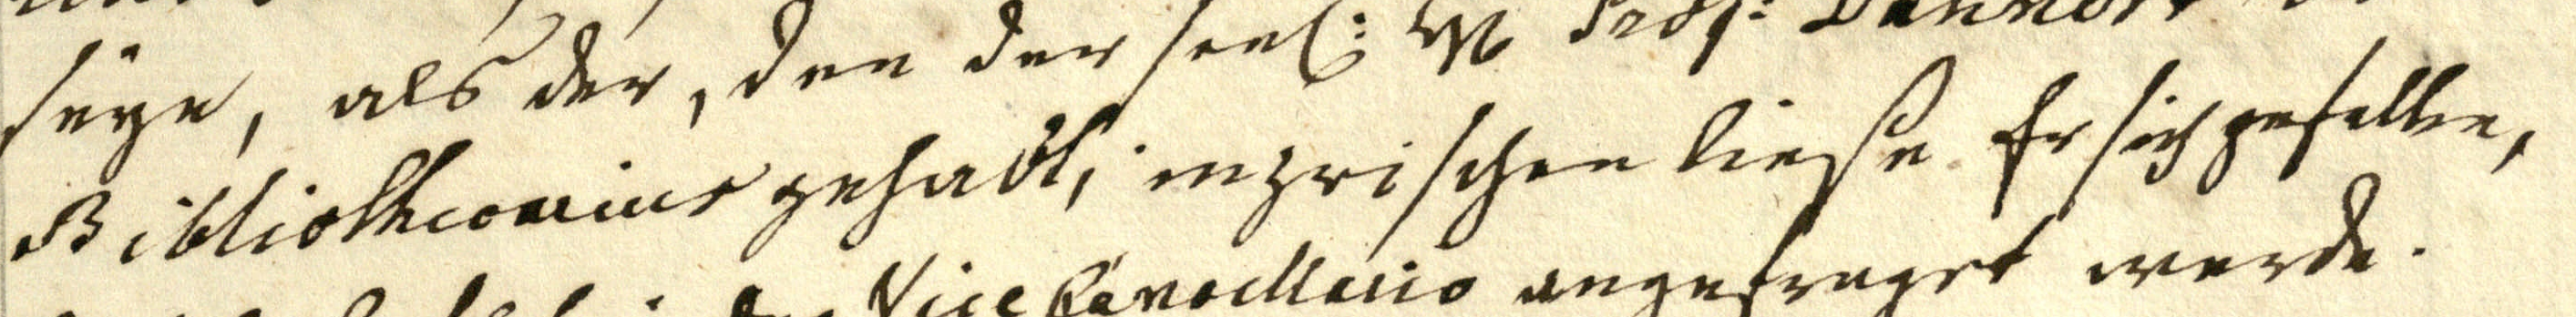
Bibliothecarius gehabt, inzwischen ließe Er sich gefallen,
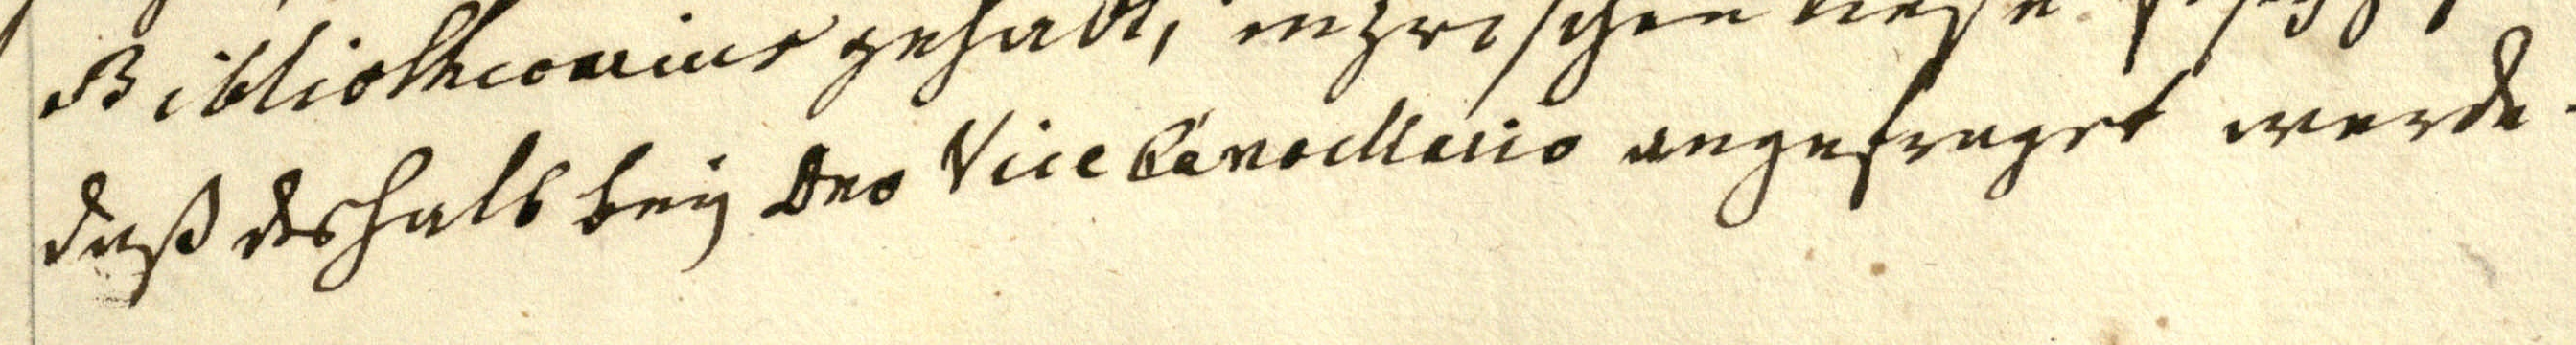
daß deshalb beÿ Dno Vice Cancellario angefraget werde.
